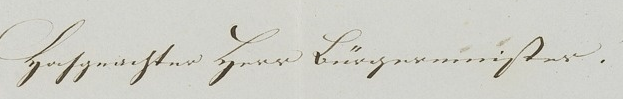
Hochgeachter Herr Bürgermeister!
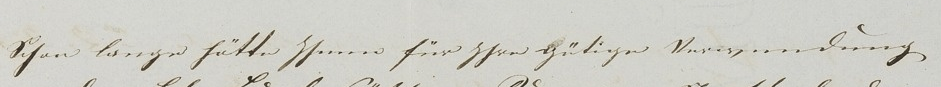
Schon lange hätte Ihnen für Ihre gütige Verwendung
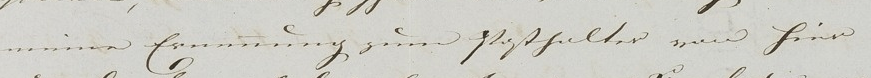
meine Ernennung zum Posthalter von hier
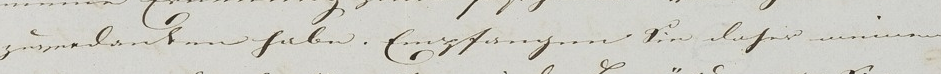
zuverdanken habe. Empfangen Sie daher meinen
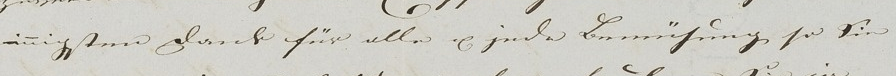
innigsten Dank für alle & jede Bemühung so Sie
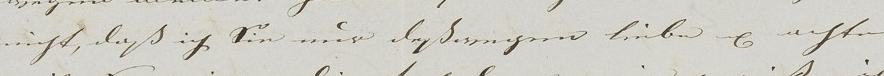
nicht, daß ich Sie nur deßwegen liebe & achte
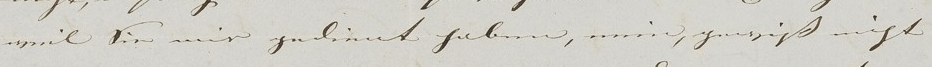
weil Sie mir gedient haben, nein, gewiß nicht
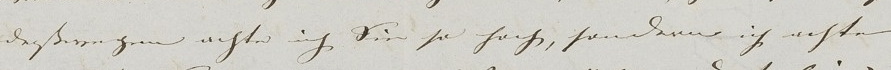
deßwegen achte ich Sie so hoch, sondern ich achte
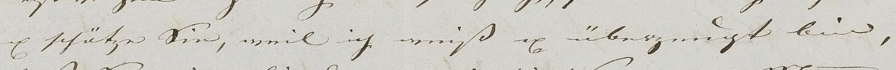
& schätze Sie, weil ich weiß & überzeugt bin,
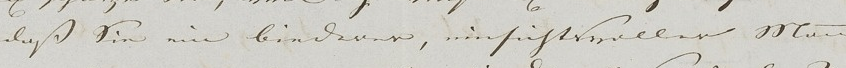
daß Sie ein biederer, einsichtsvoller Mann
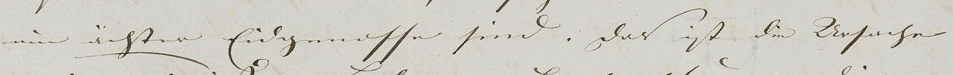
ein ächter Eidgenosse sind. Das ist die Ursache
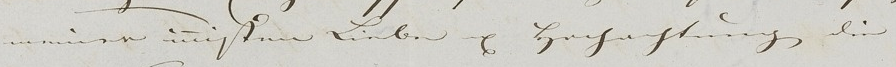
meiner innisten Liebe & Hochachtung die
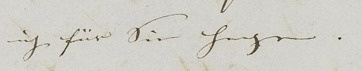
ich für Sie hege.
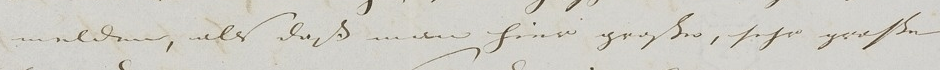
melden, als daß man hier große, sehr große
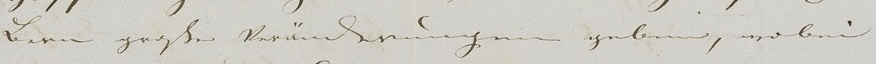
Bern große Veränderungen geben, wobei
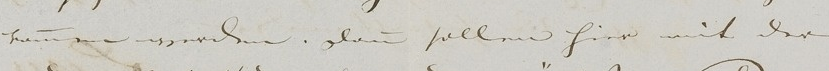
kommen werden. Dann sollen hier mit der
